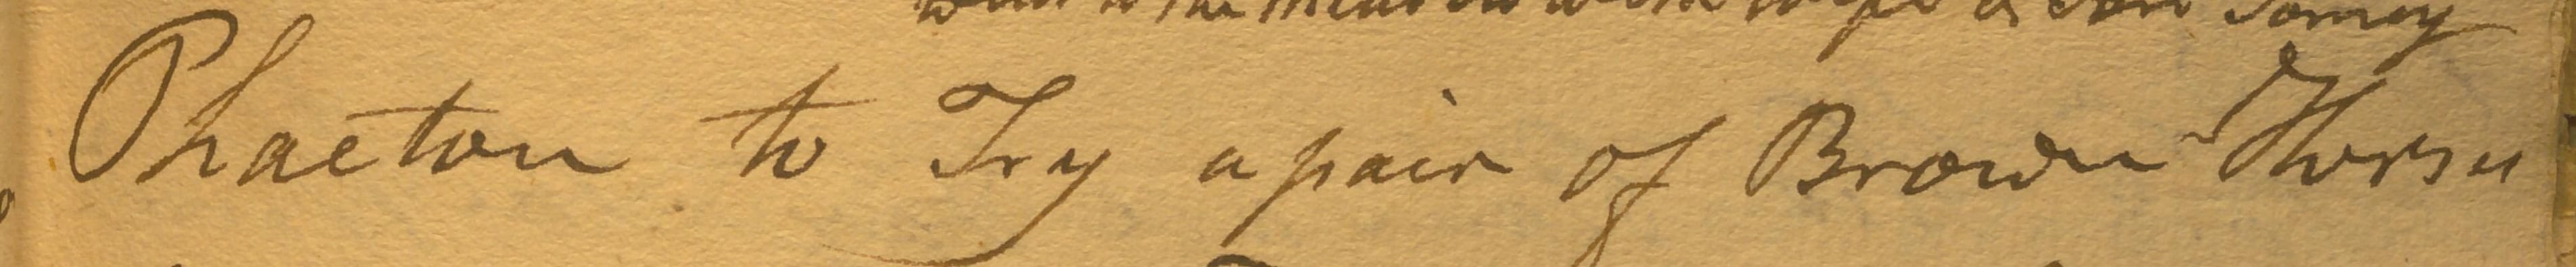Phaeton to Try a pair of Brown Horses
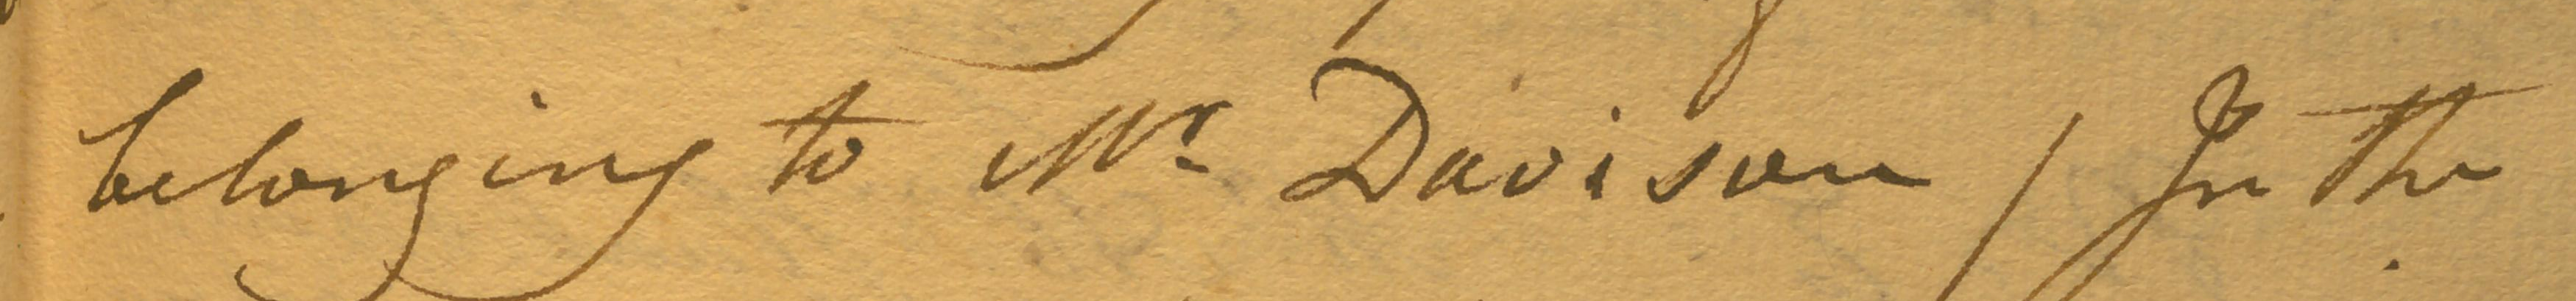belonging to M^r. Davison / In the
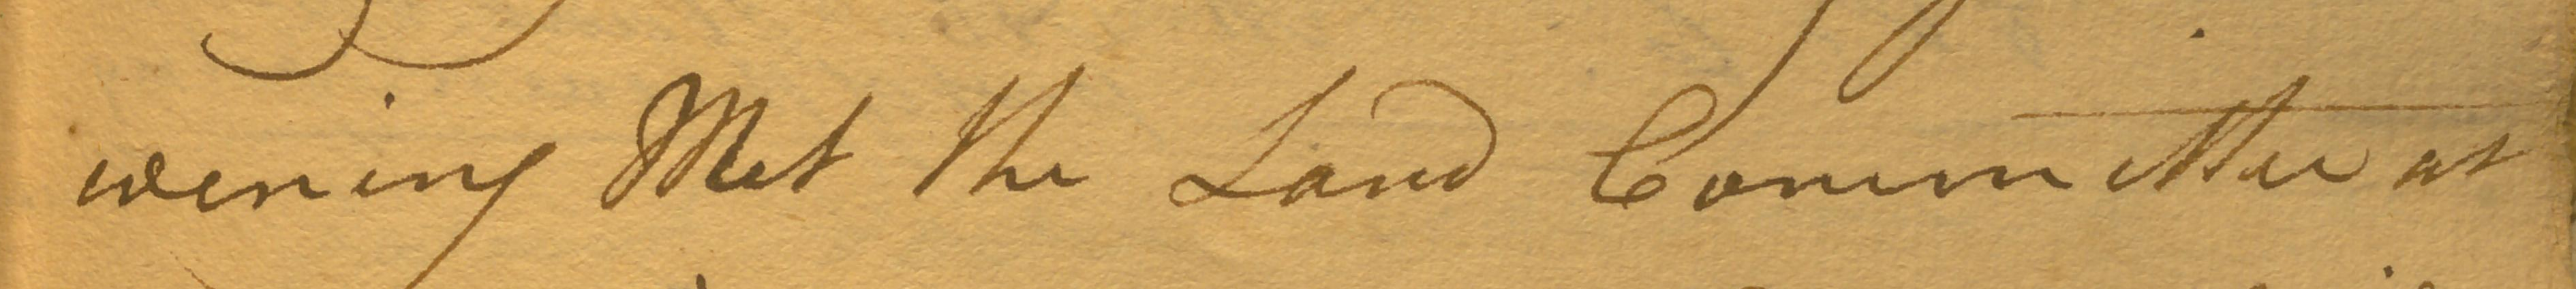evening Met the Land Committee at
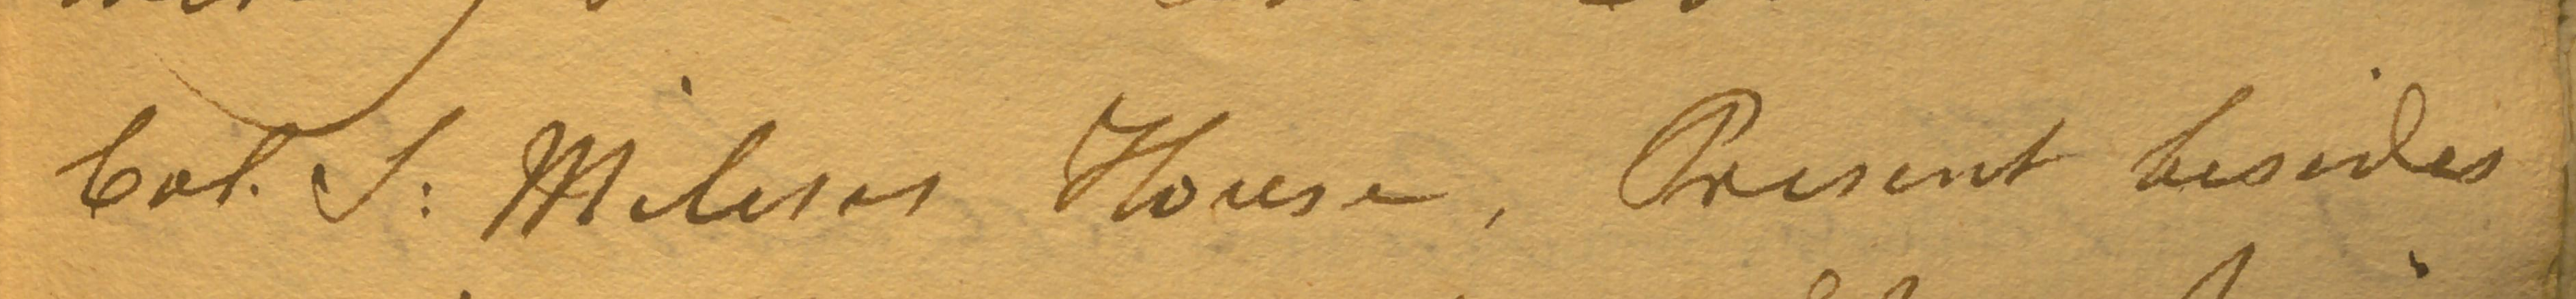Col. S:. Mileses House Present besides
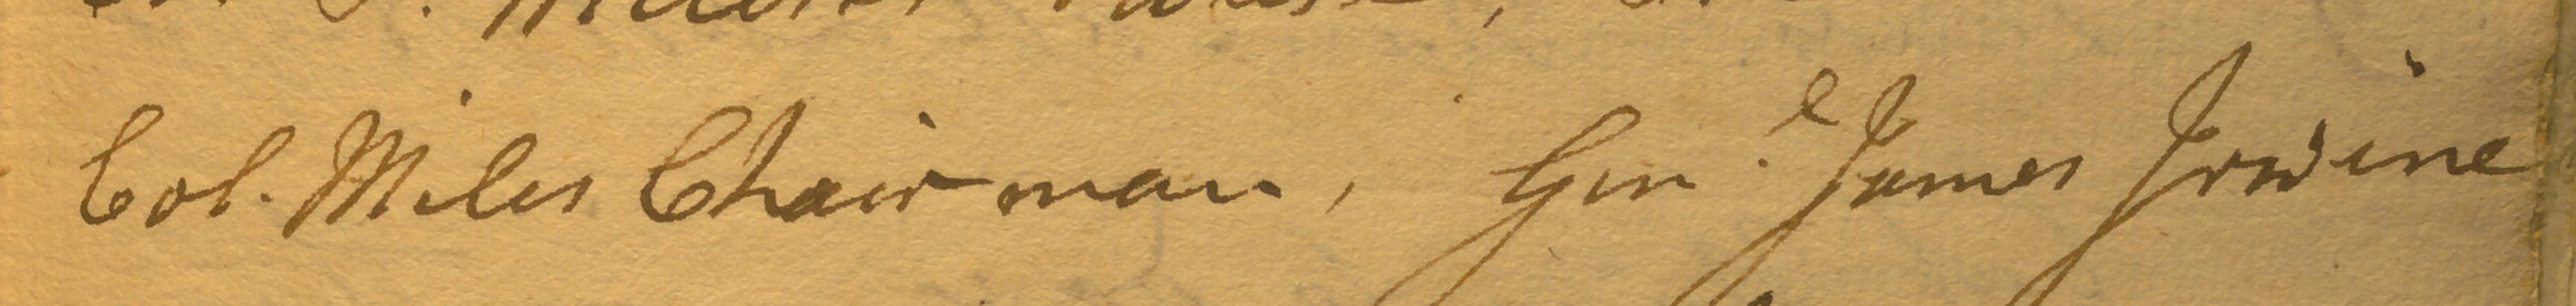Col. Miles Chairman, Gen^l. James Irwine
